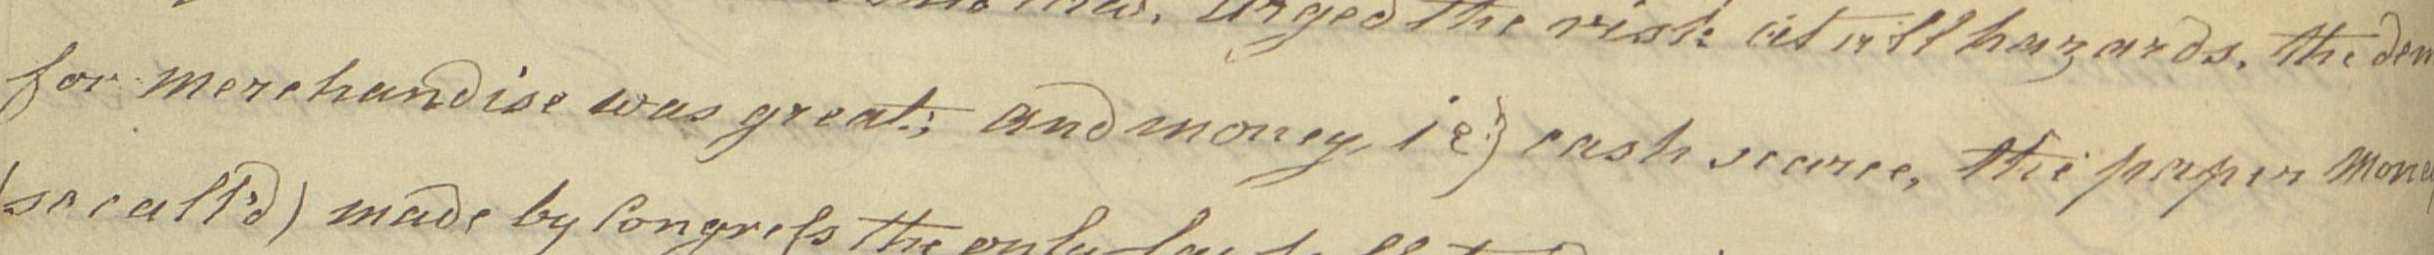for merchandise was great; and money ie) cash scarce, the proper Money
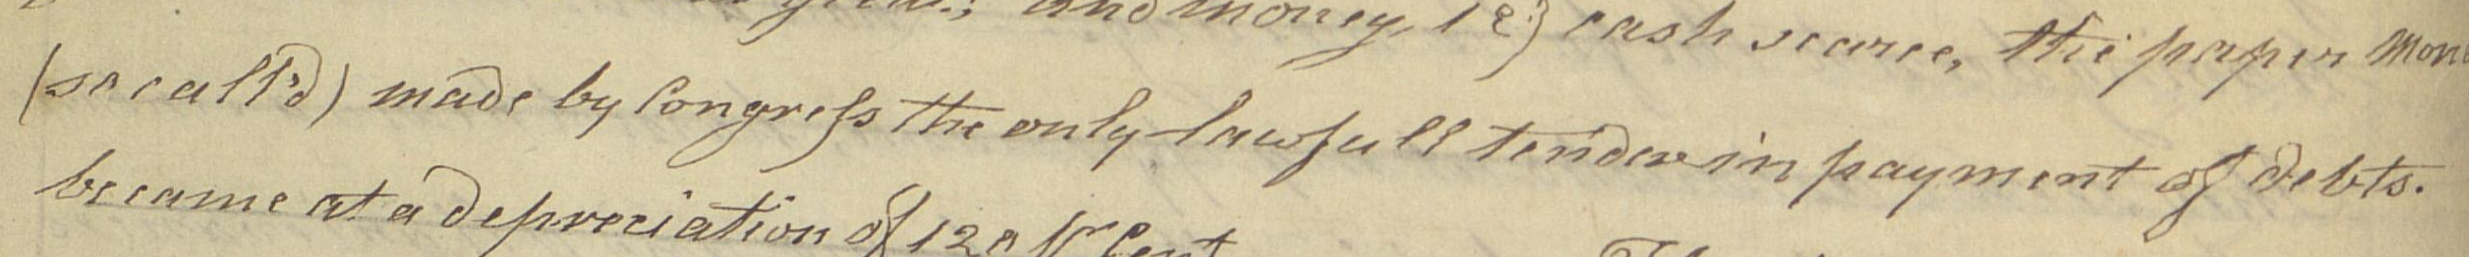(so call'd) made by Congress the only Lawfull tender in payment of debts.
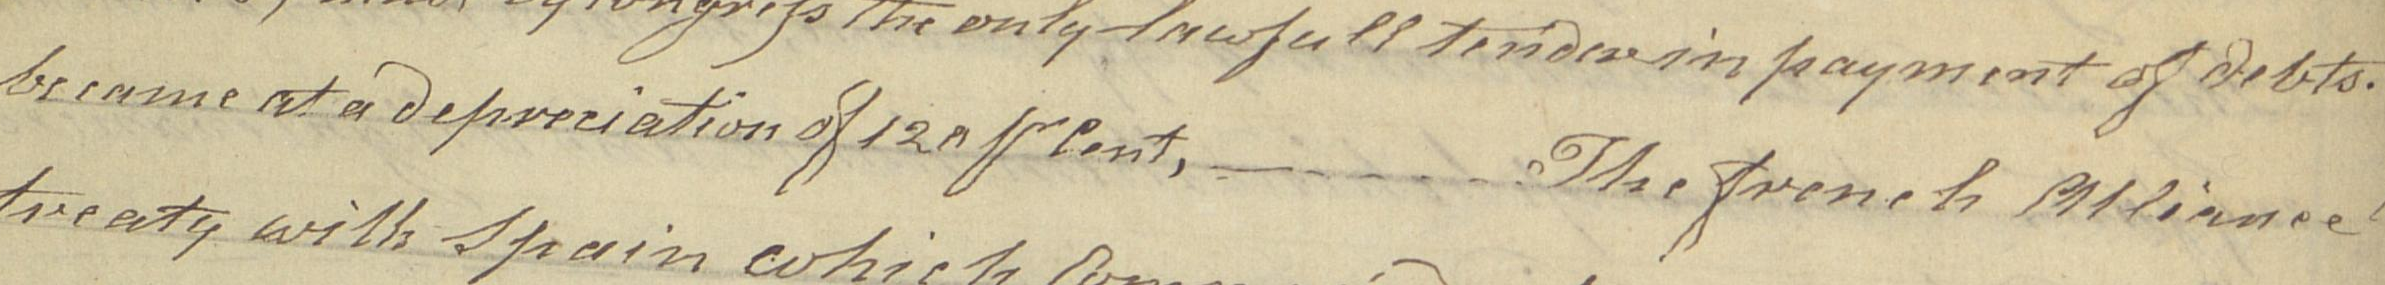became at a depreciation of 120 per Cent, The french Alliance and
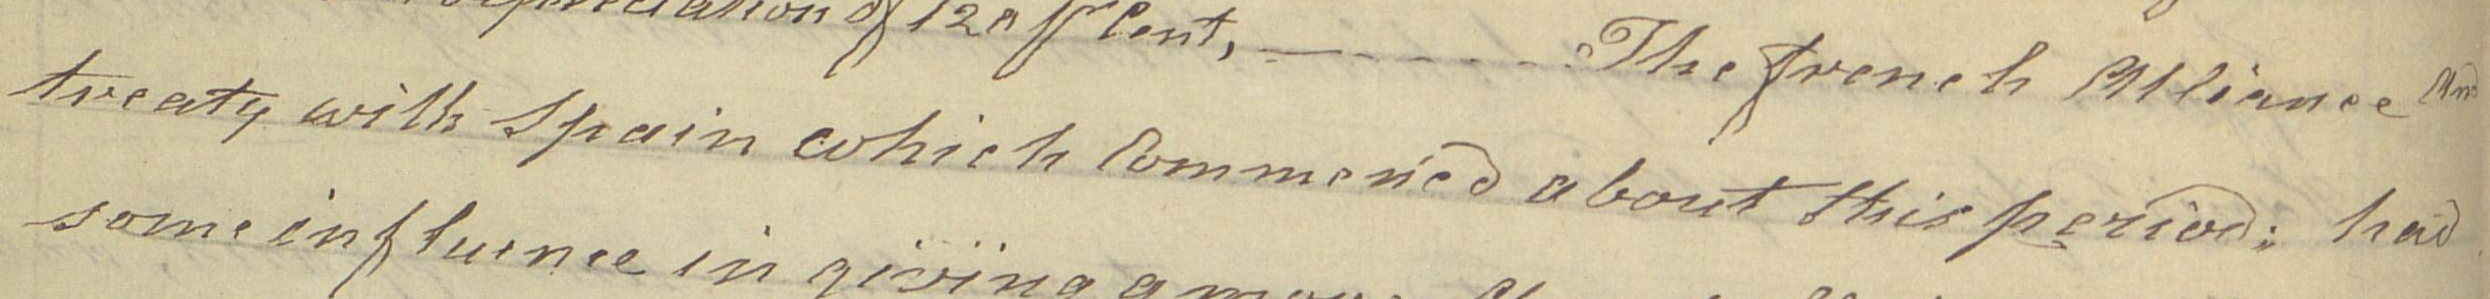treaty will Spain which commenc'd about this period; had
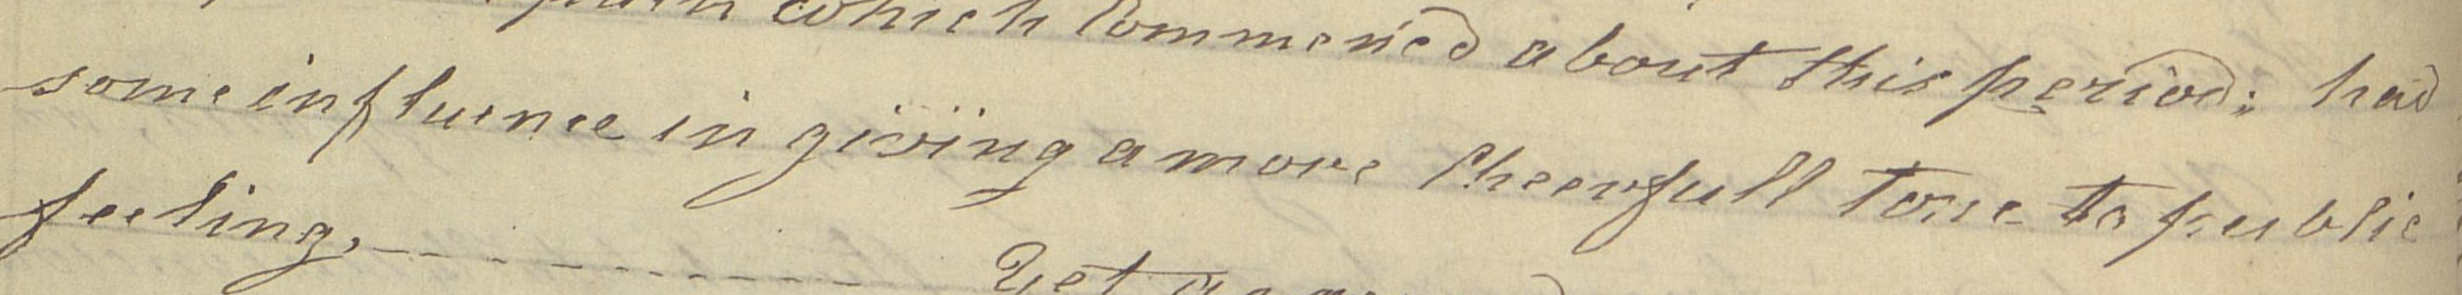some influence in giving a more cheerfull tone to public
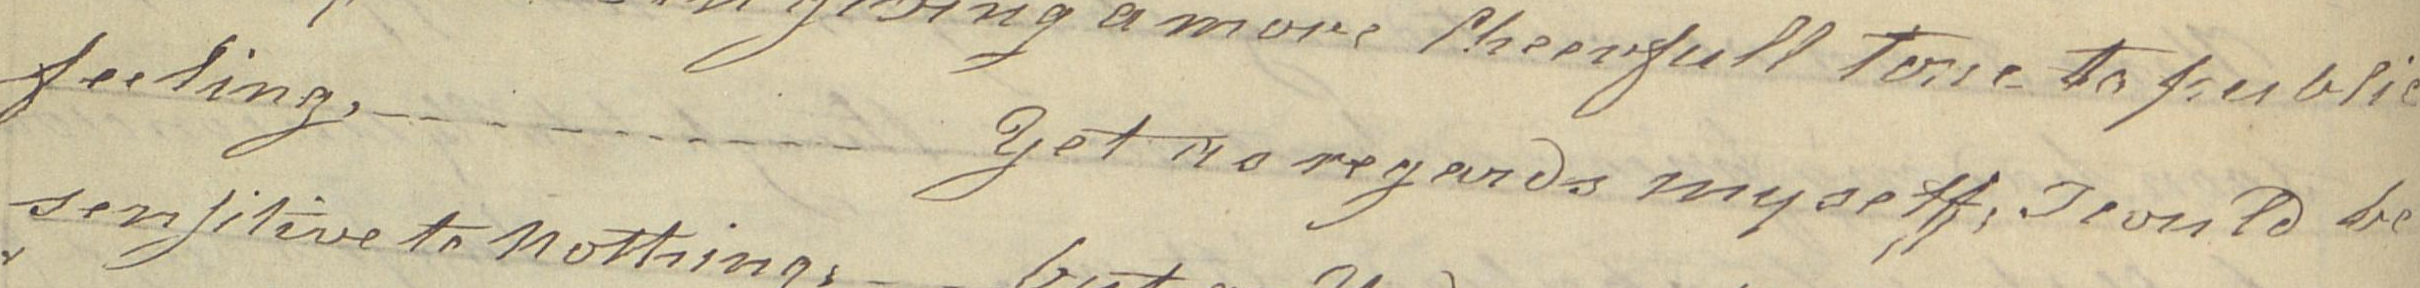feeling, Yet no regards myself, I could be
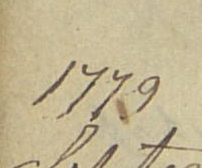1779
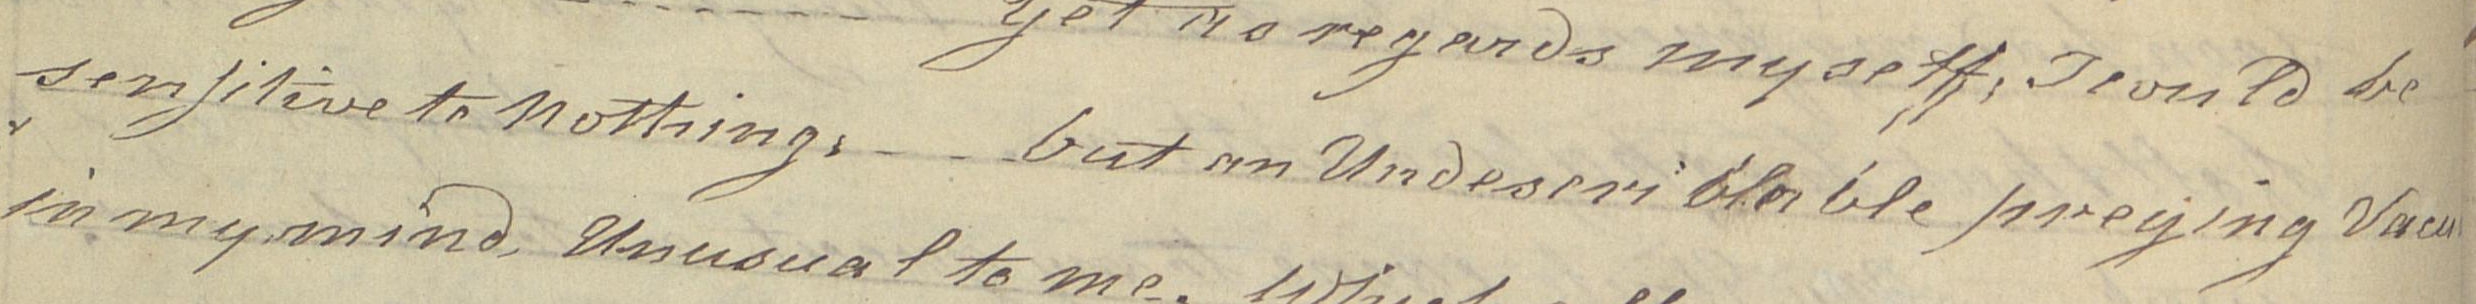sensitive to nothing. but on Undesirable preying Vac-
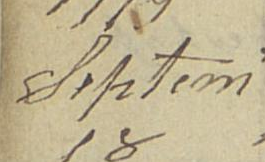Septem^r
